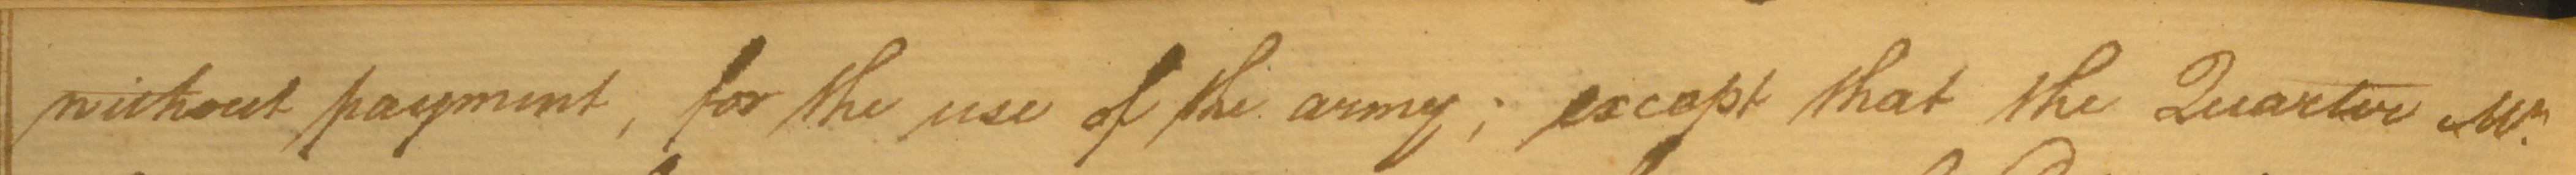without payment, for the use of the army; except that the Quarter M^r.
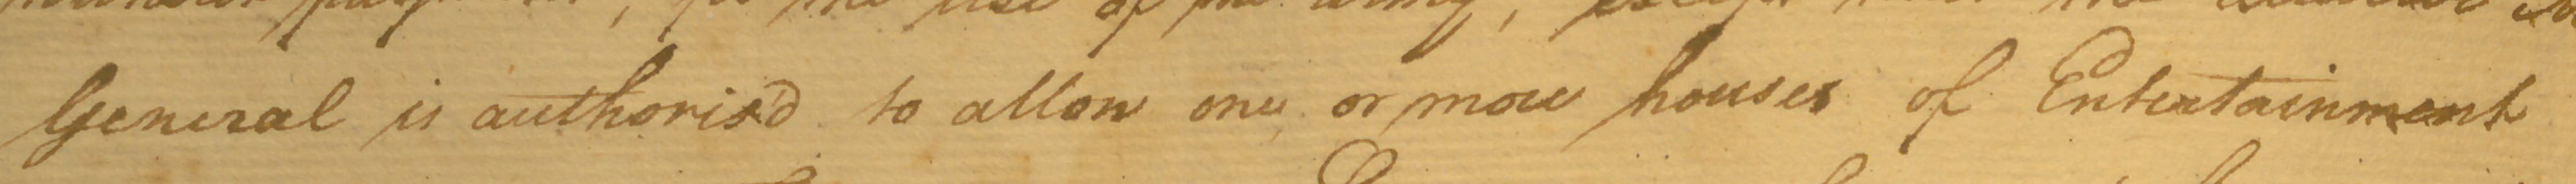General is authoris'd to allow one or more houses of Entertainment
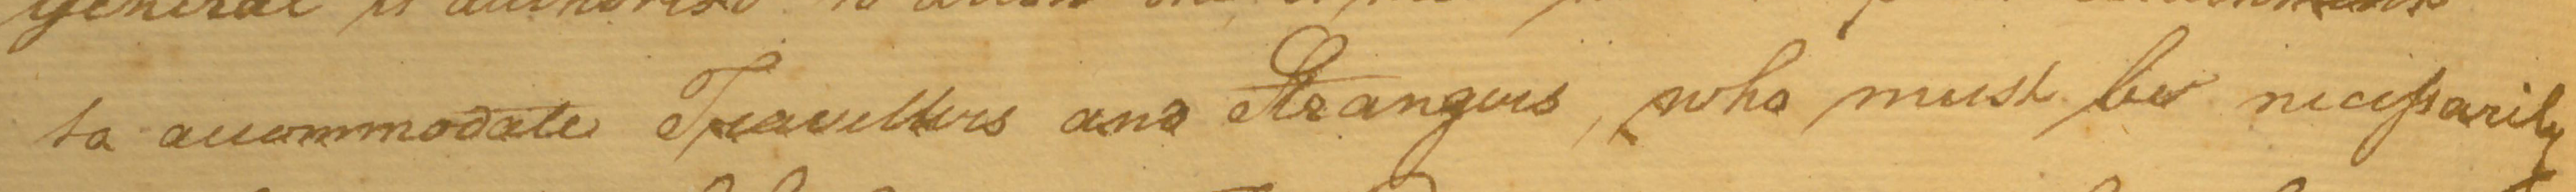to accommodate Travellers and Strangers, who must be necessarily
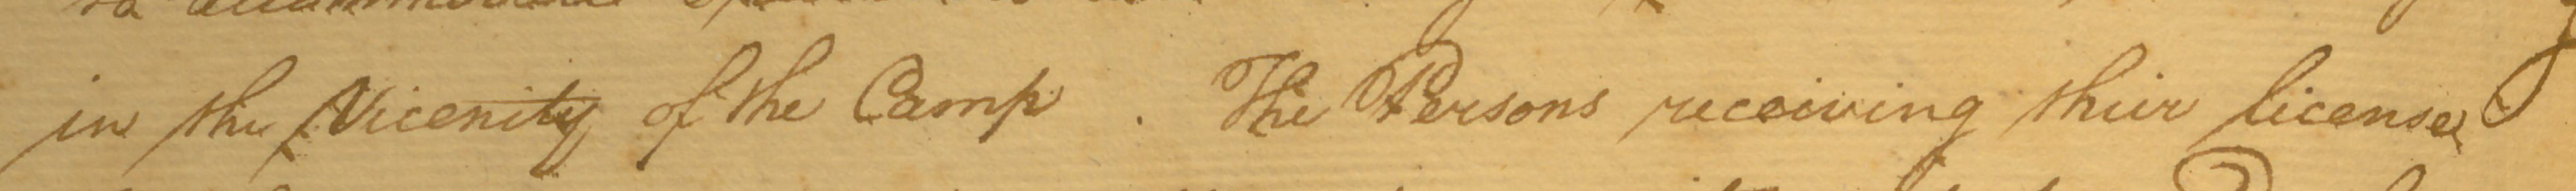in the Vicenity of the Camp. The Persons receiveing their license
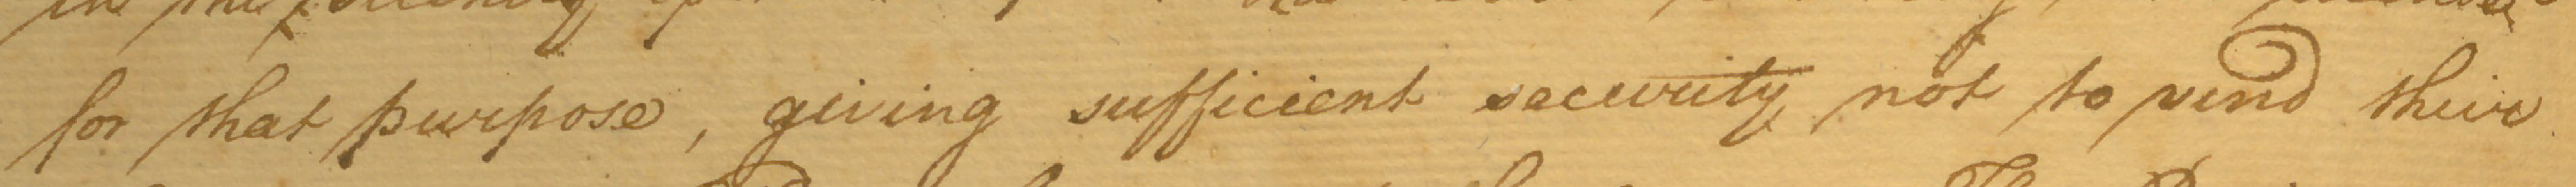for that purpose, giving sufficient security not to vend their
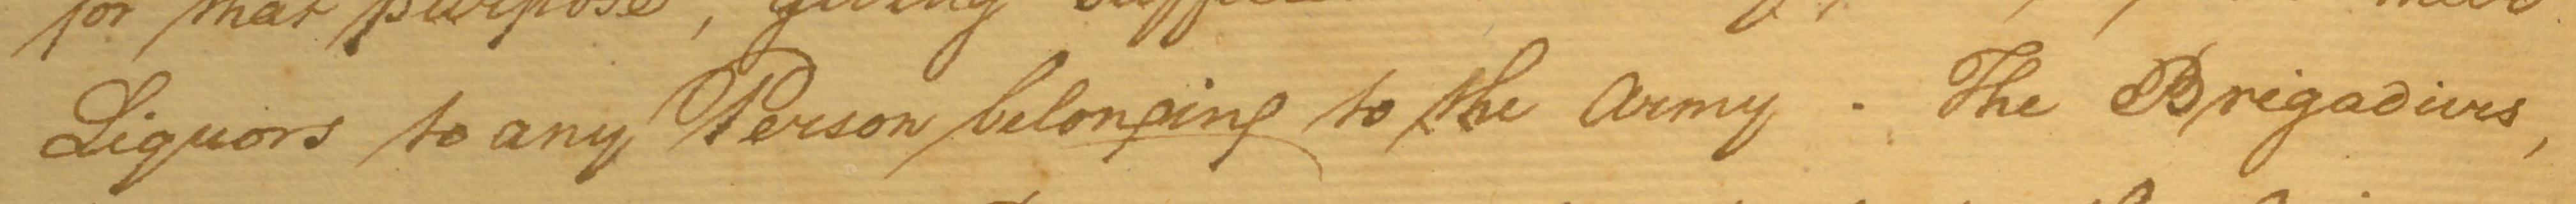Liquors to any Person belonging to the army. The Brigadiers
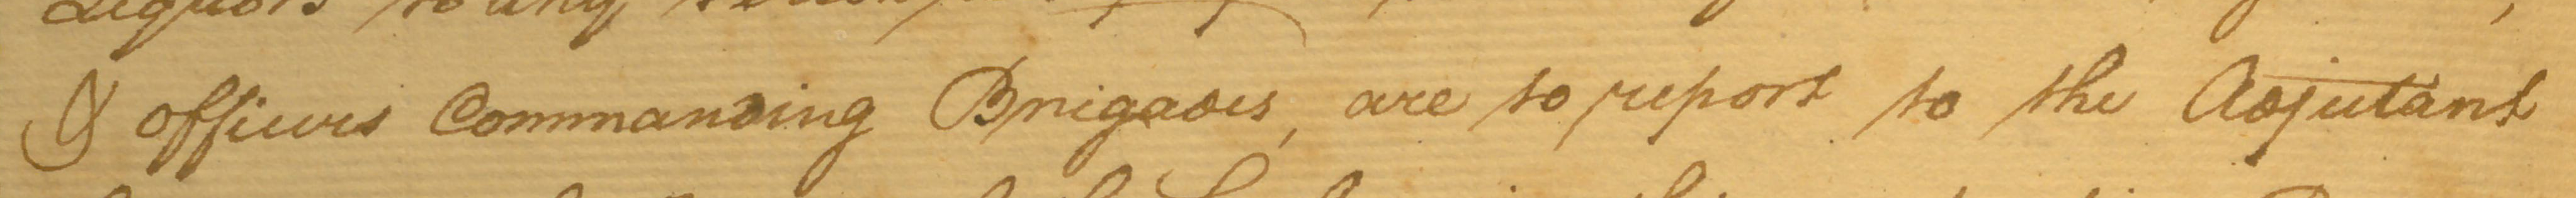& officers Commanding Brigades, are to report to the Adjutant
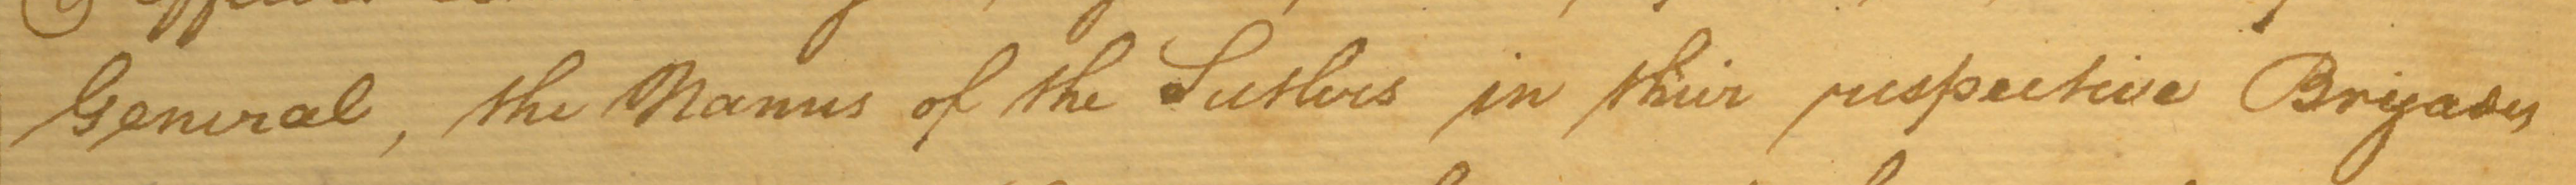General, the Names of the Sutlers in their respective Brigades
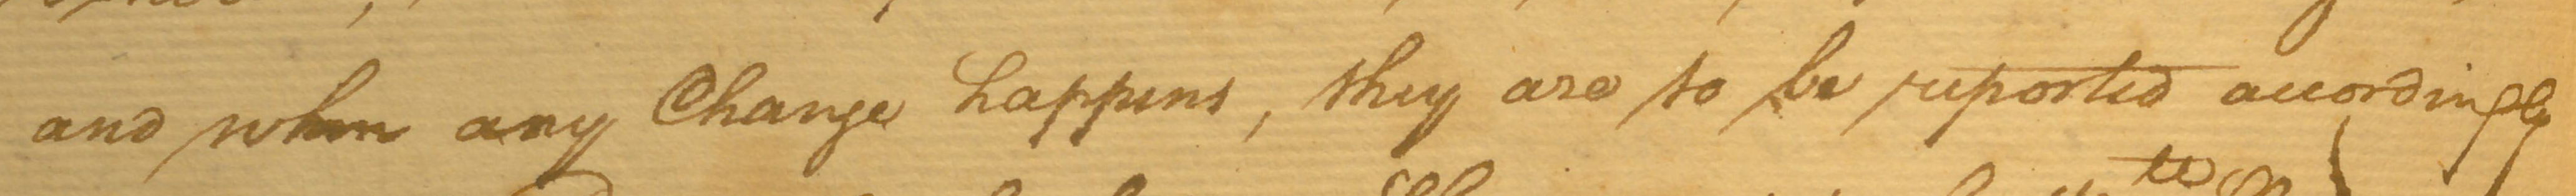and when any Change happens, they are to be reported accordingly
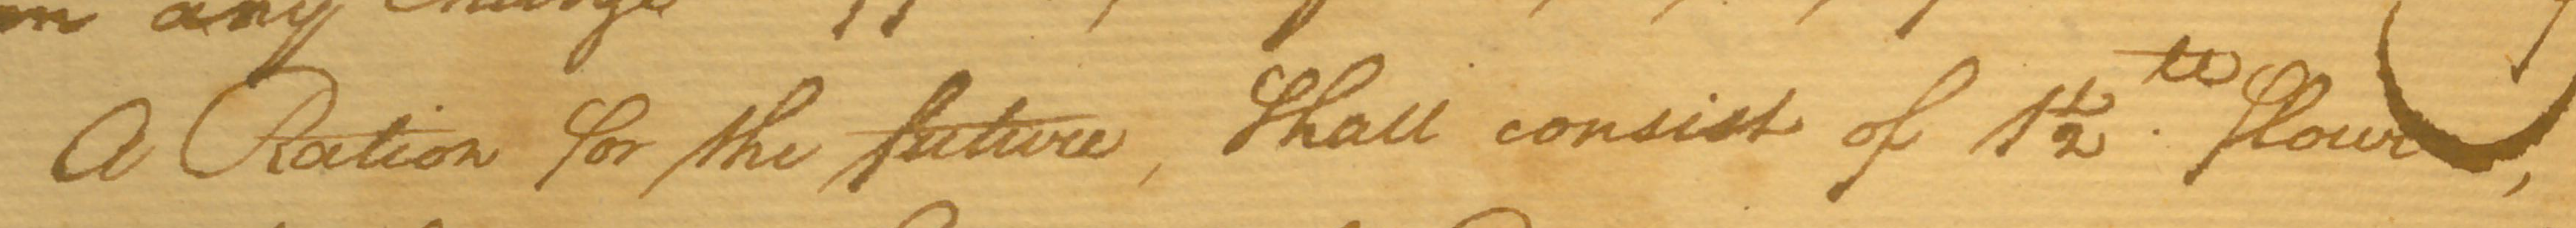A Ration for the future, shall consist of 1 1/2 ^lb flour,
